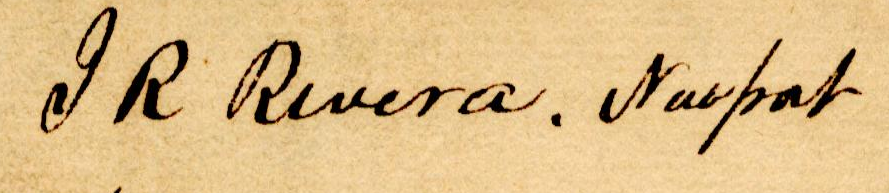J R Rivera. Naupat
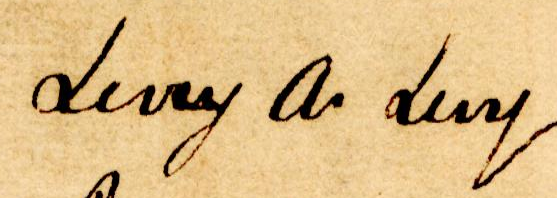Levy A Levy
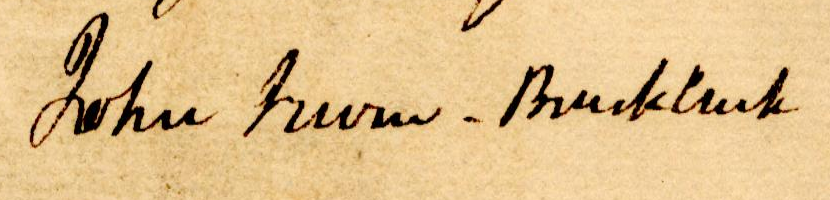John Reves- Brucklack
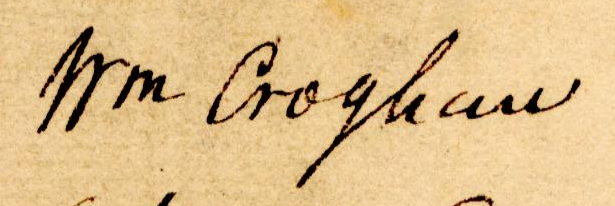W^m Croghan
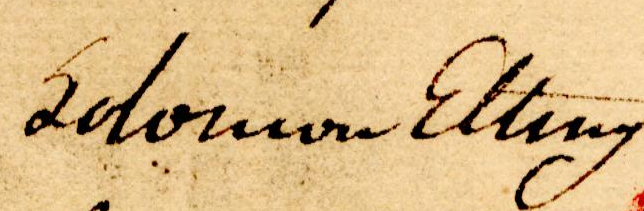Solomon Etting
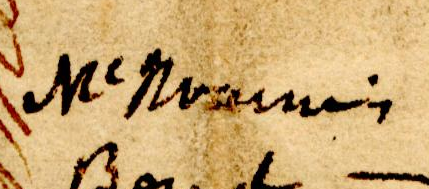M^c. Nuames
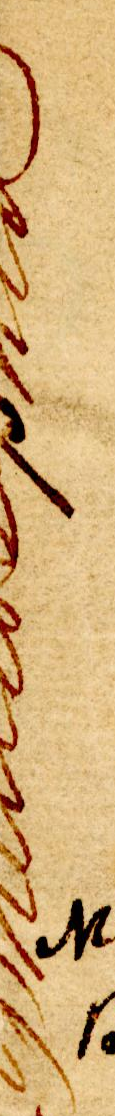Philledelphia
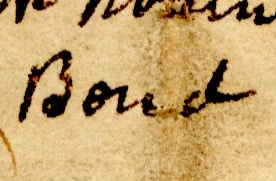Bond
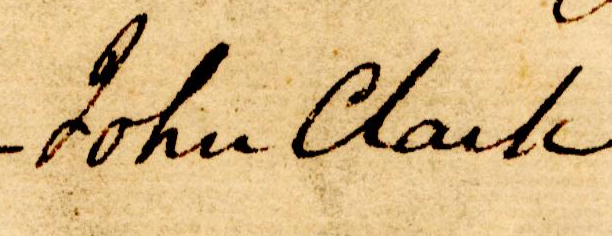John Clark
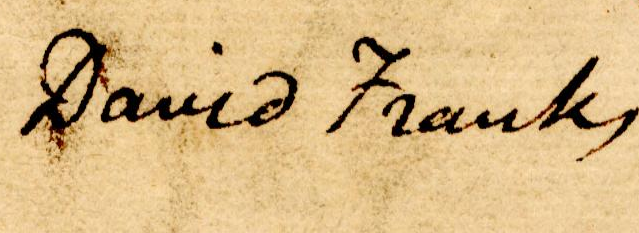David Franks
